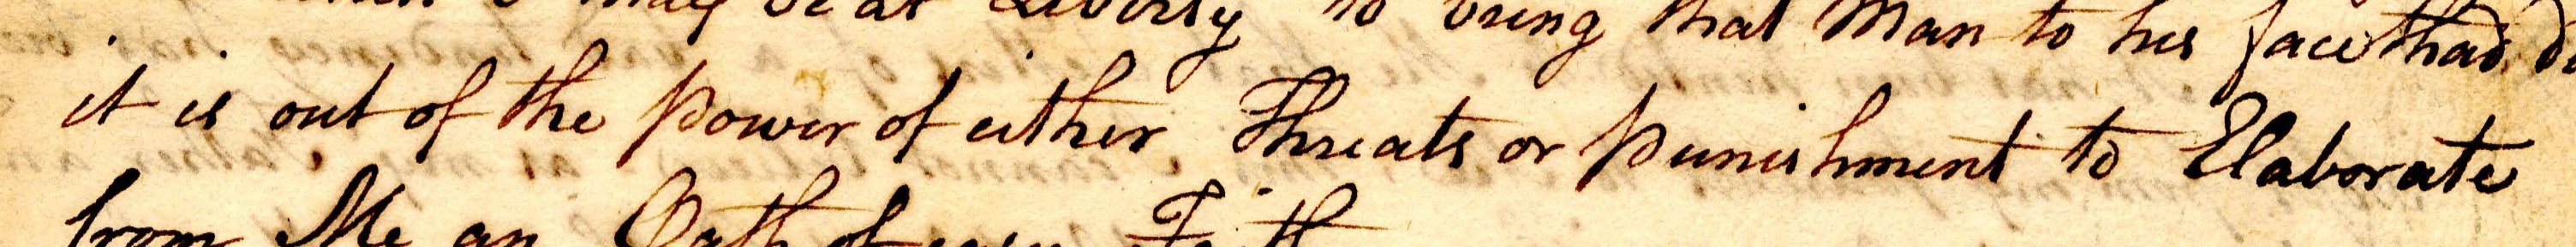it is out of the power of either. Threats or punishment to Elaborate
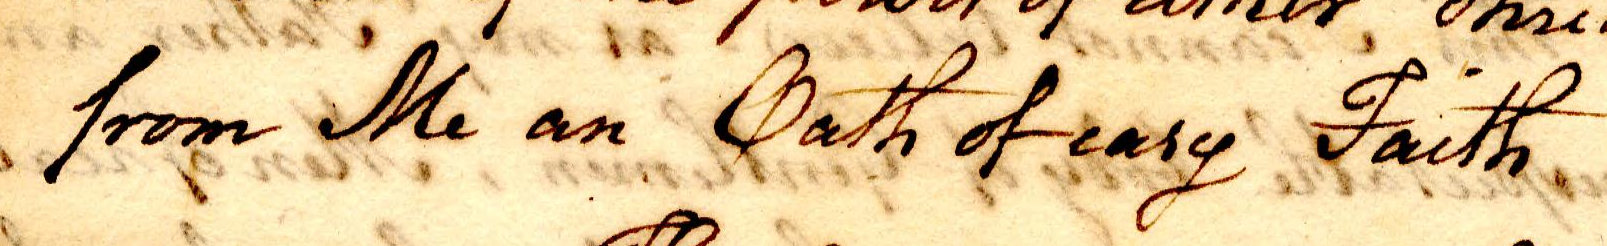from Me an Oath of easy Faith.
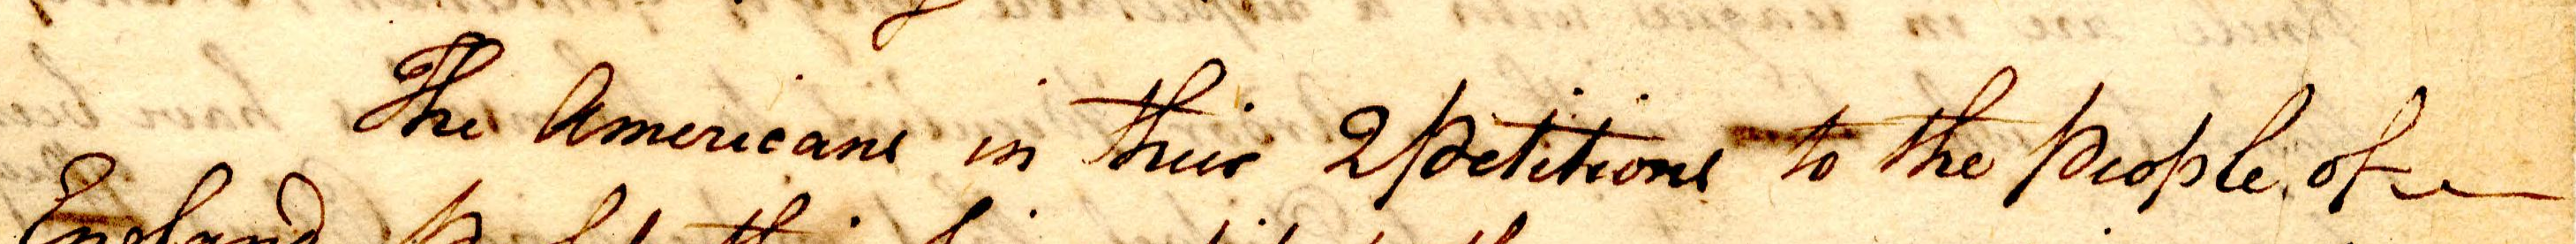The Americans in their 2 Petitions to the people of
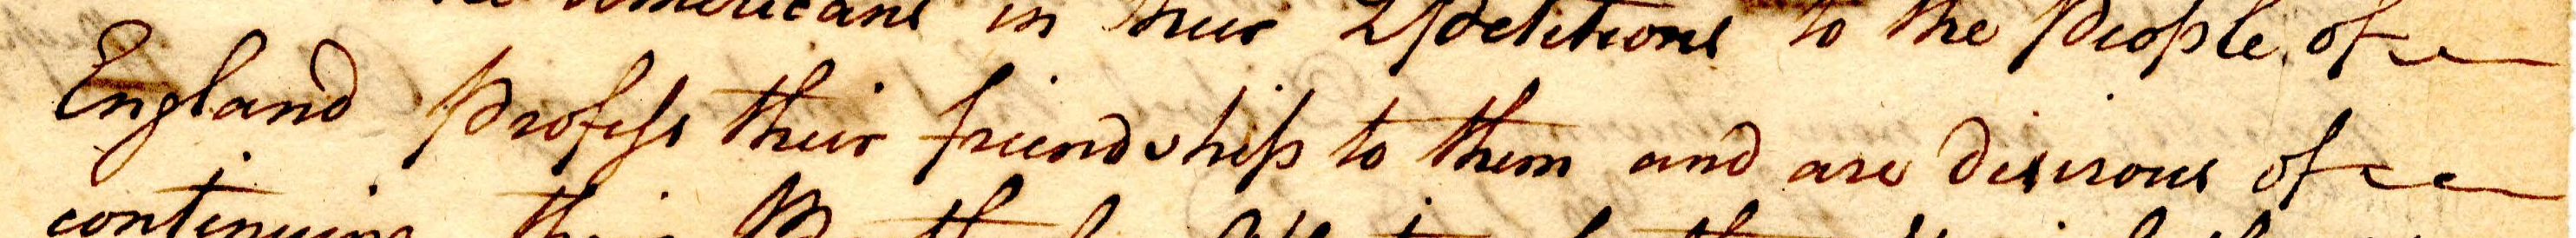England profess their friendship to them and are desirous of
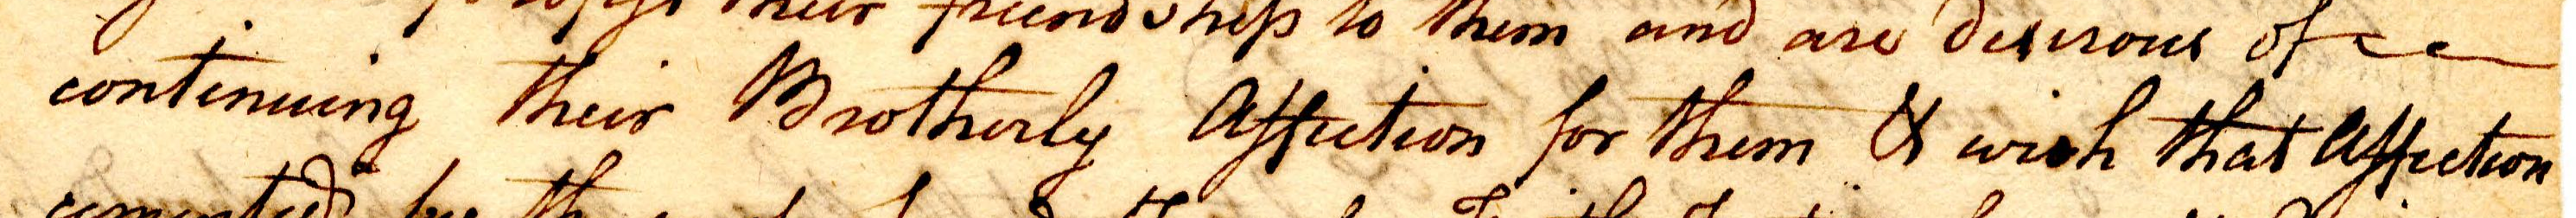continuing their Brotherly Affection for them & wish that Affection
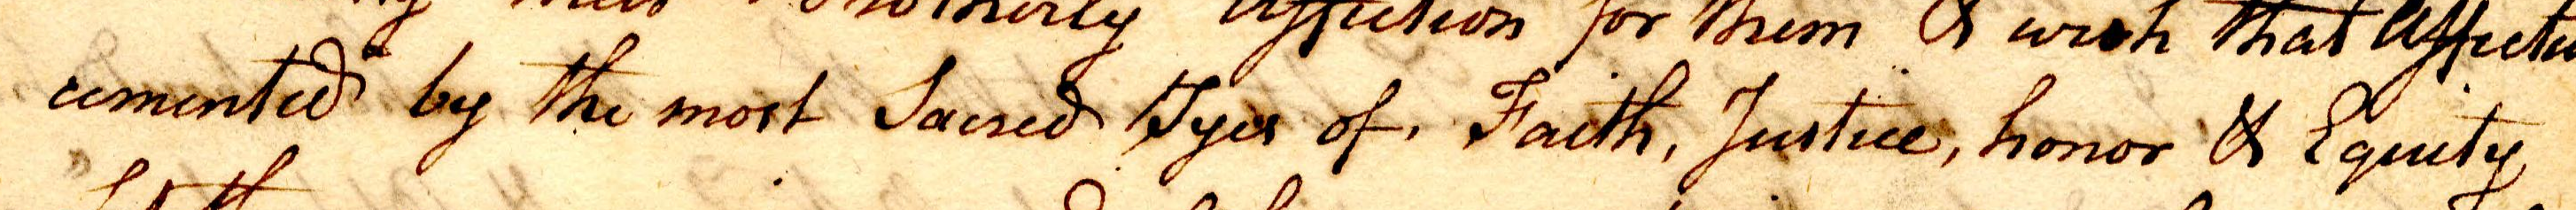cemented by the most Sacred Tyes of Faith, Justice, honor & Equity
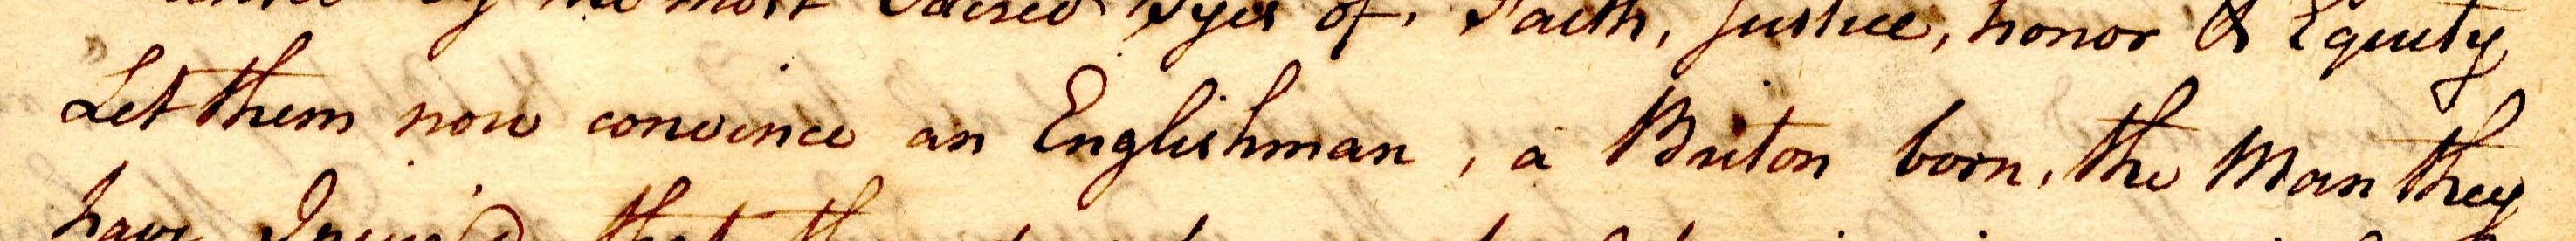"Let them now convince an Englishman, a Briton born, the Man they
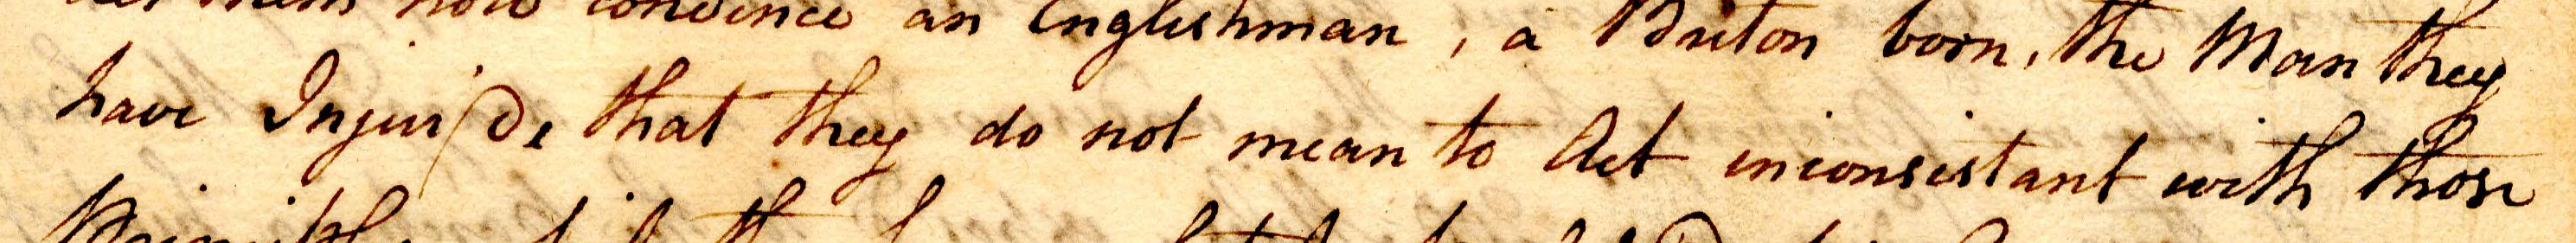have Injur'd, that they do not mean to Act inconsistant with those
